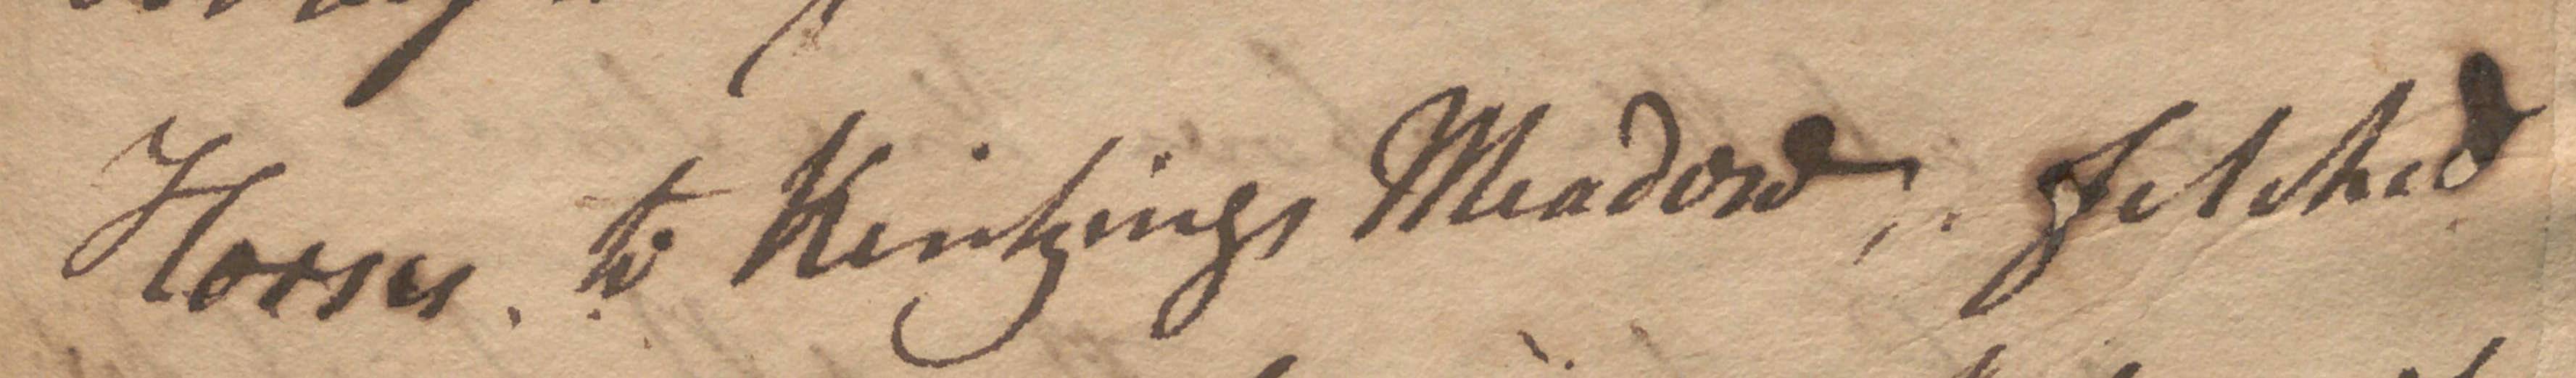Horses to Kintzings Meadow, fetched
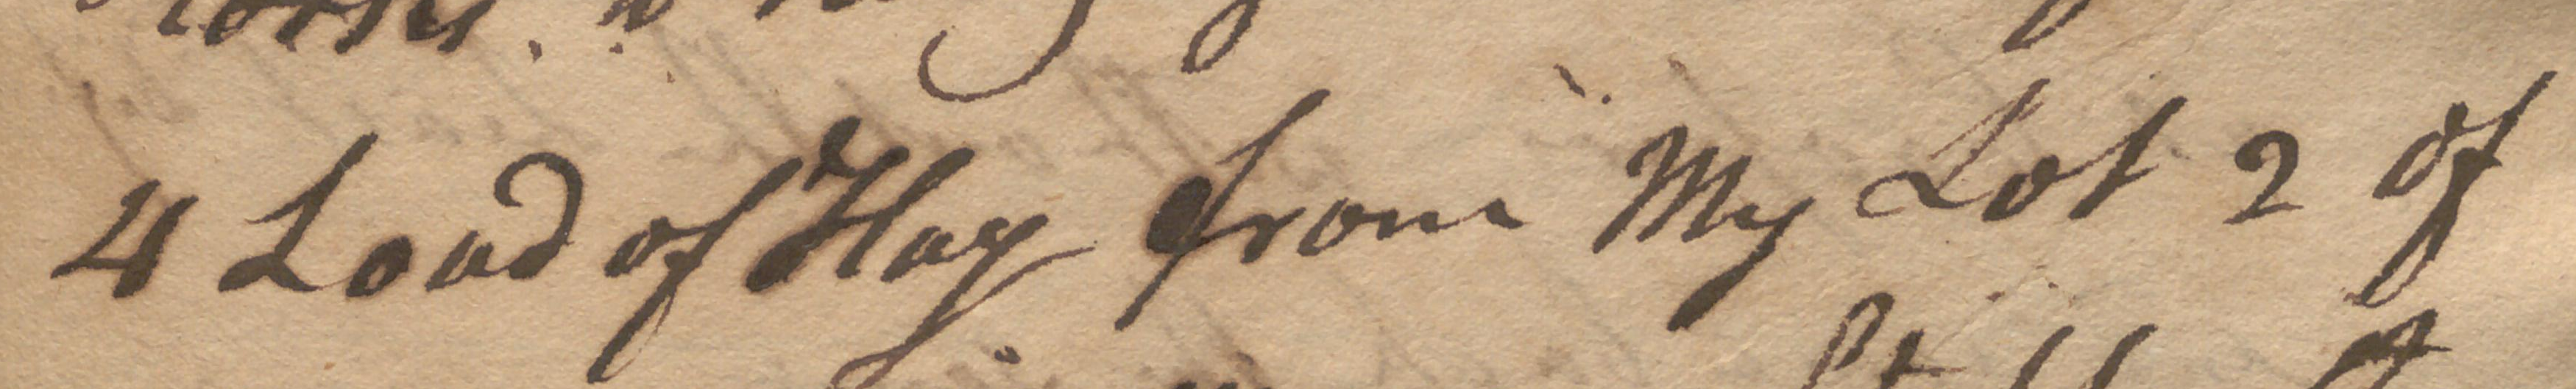4 Load of Hay from My Lot 2 of
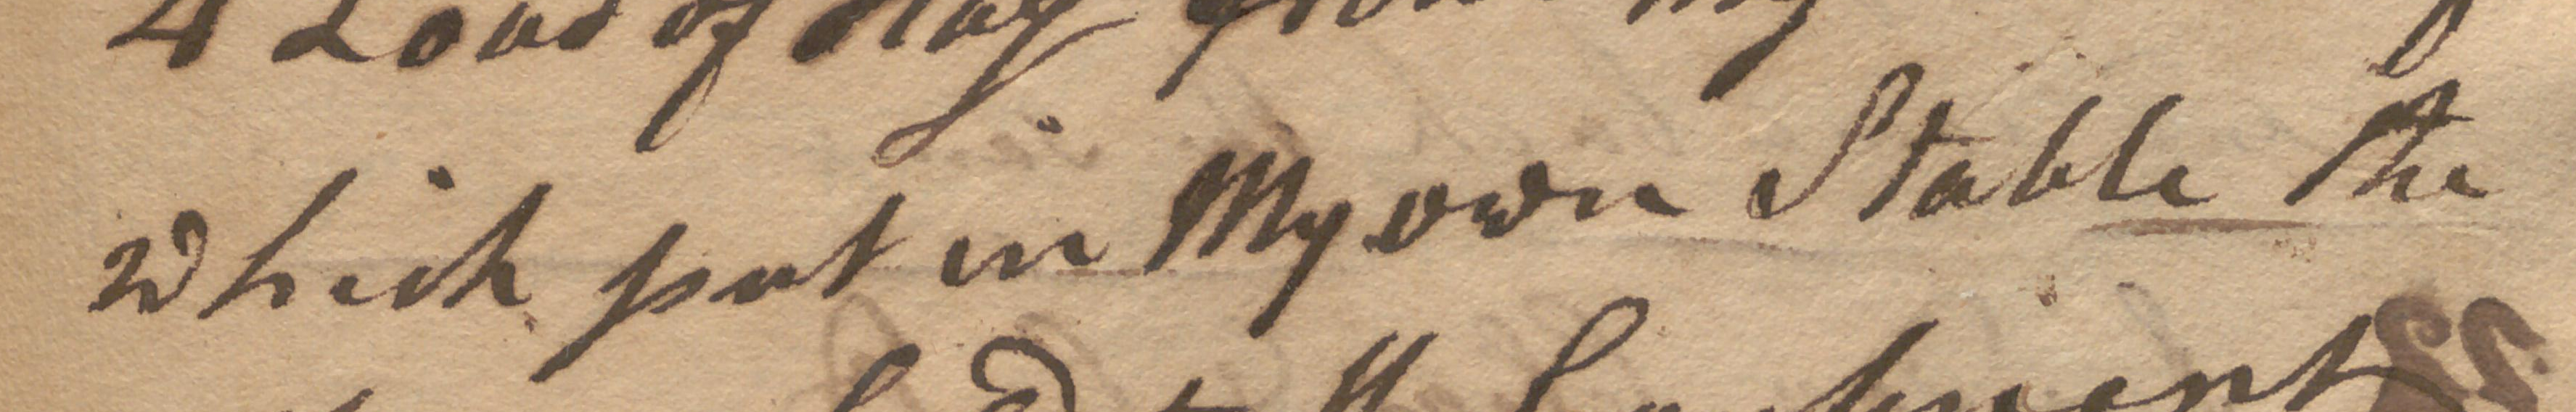which put in My own Stable the
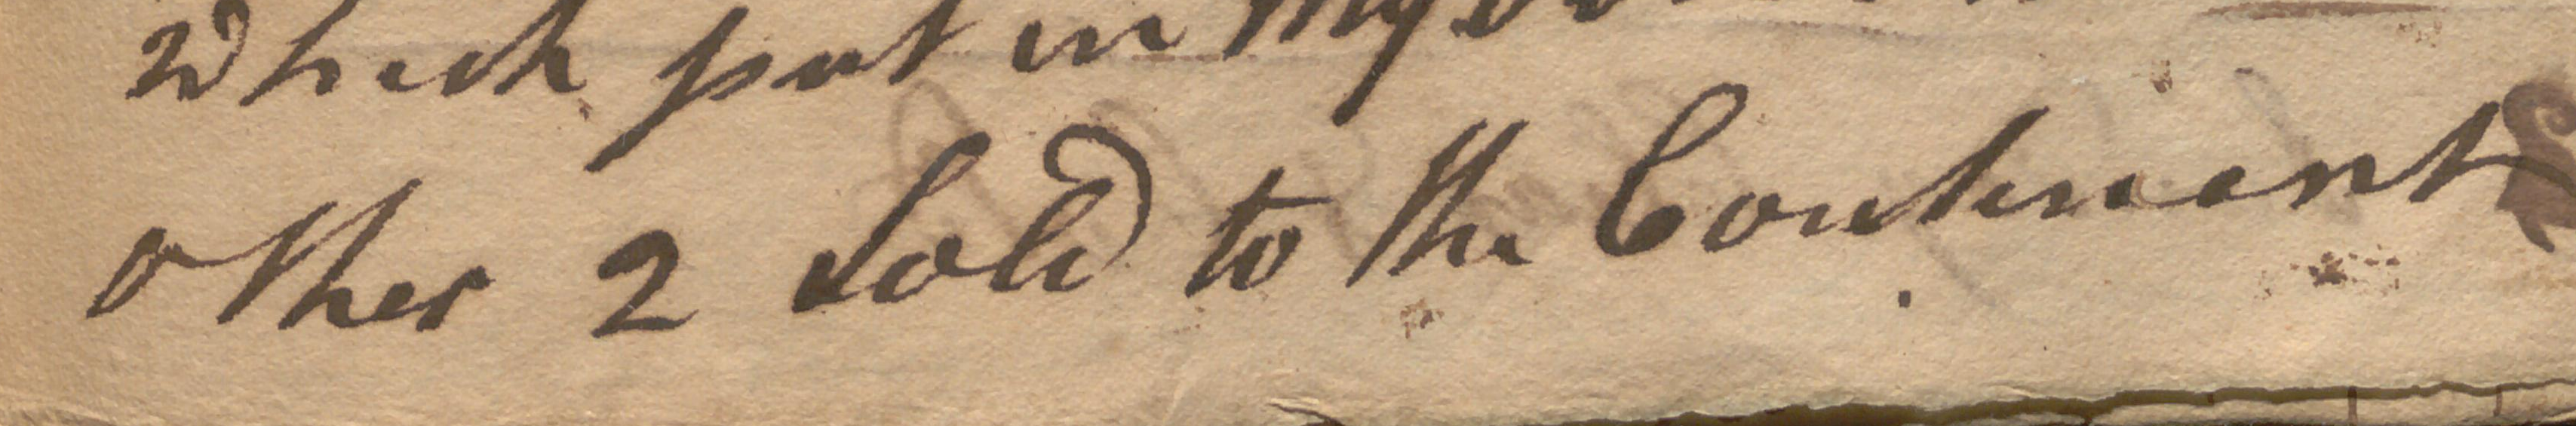other 2 sold to the Continent
